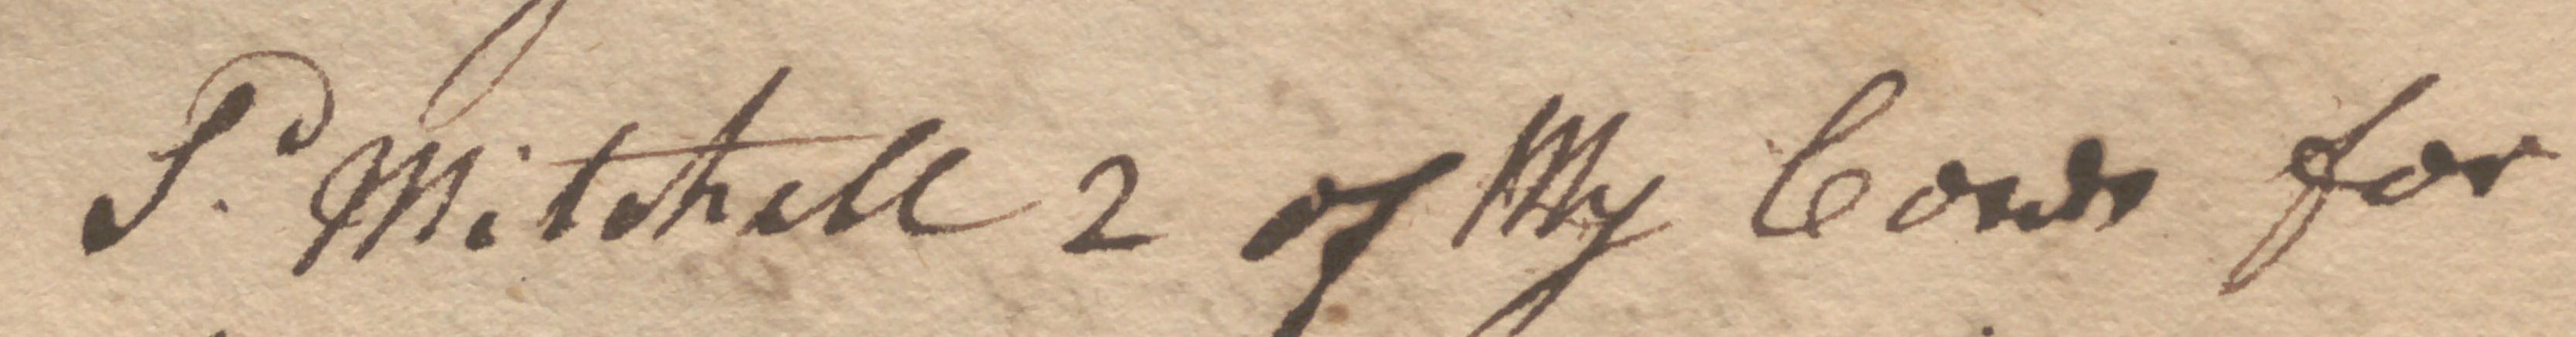S^d. Mitchell 2 of My Cows for
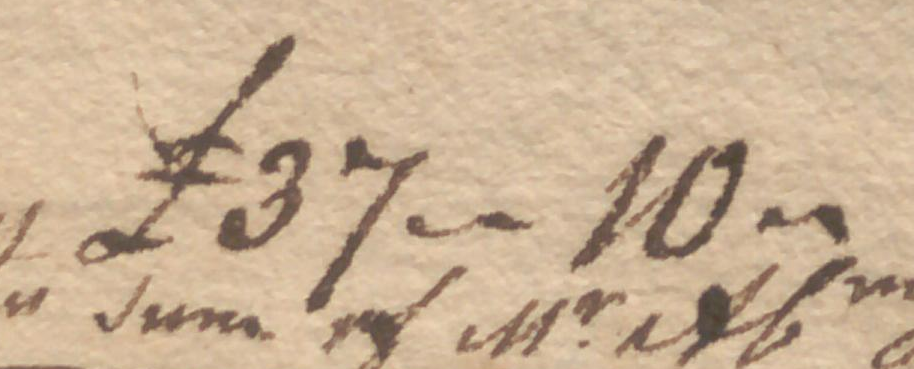£37.10-
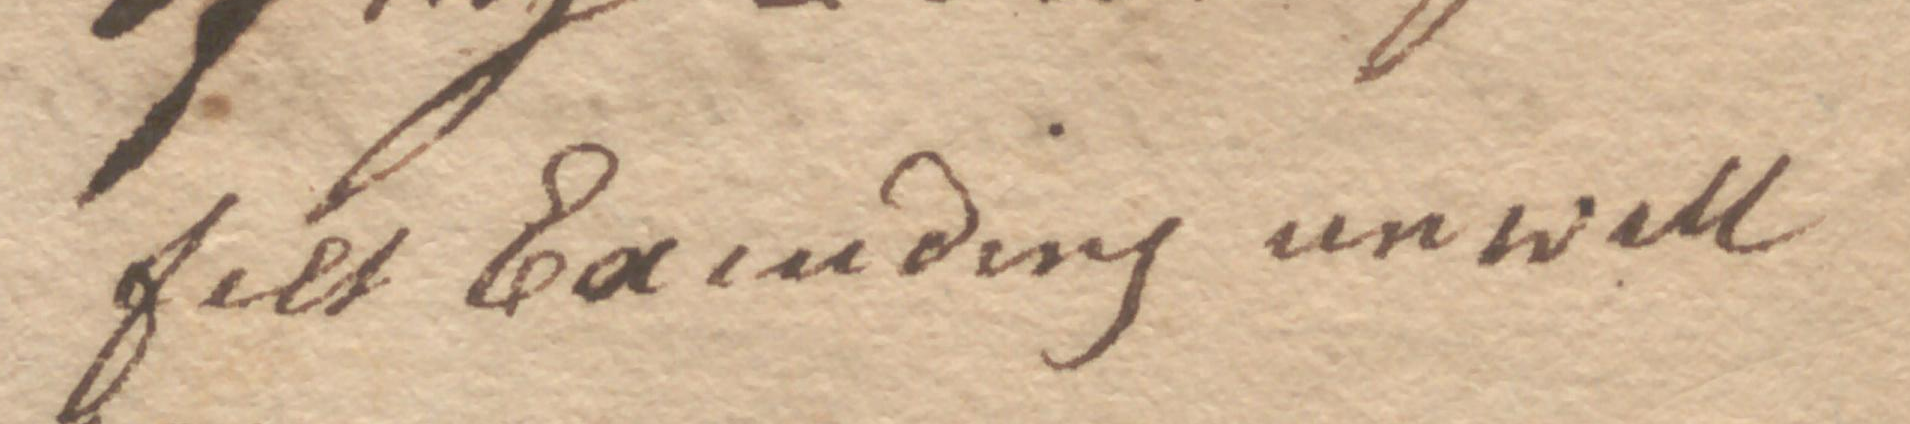felt Exceeding unwell
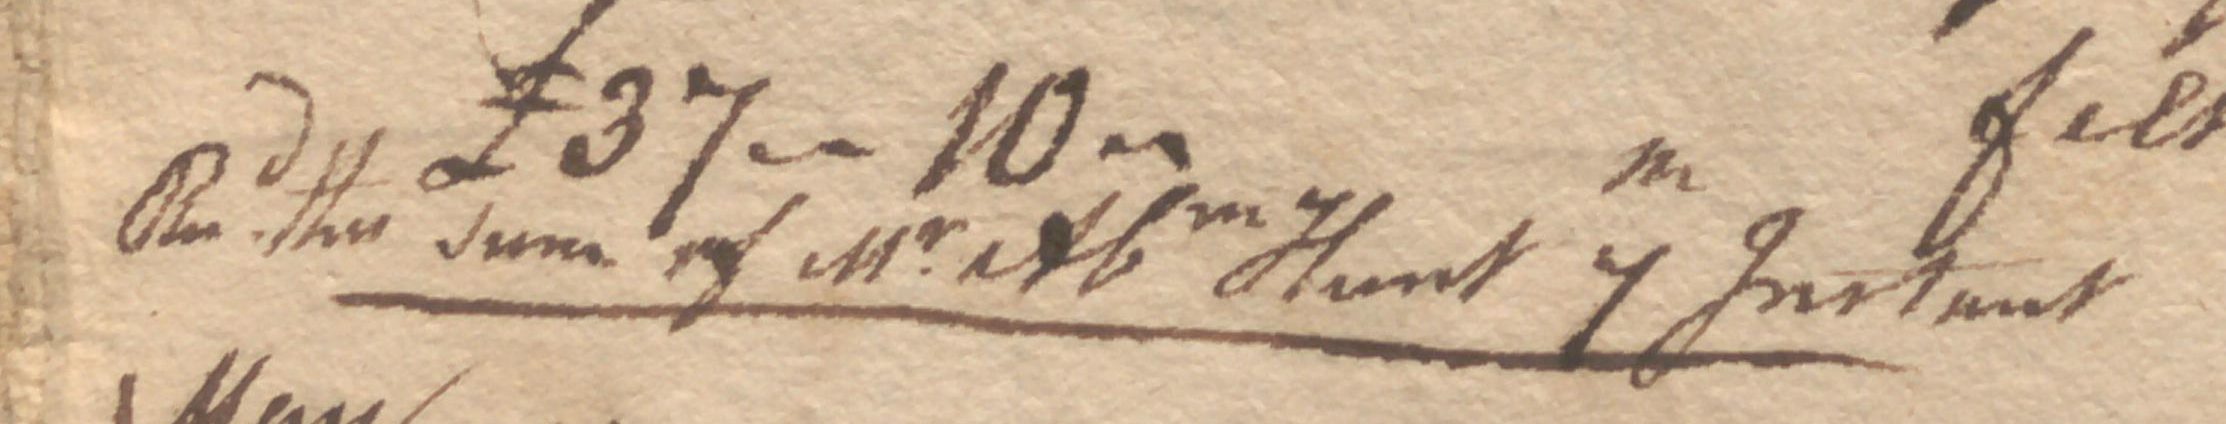Rec^d. this sum of M^r Ab^m Hunt 7^th Instant
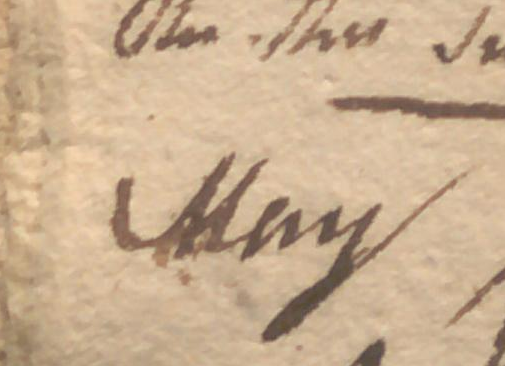May
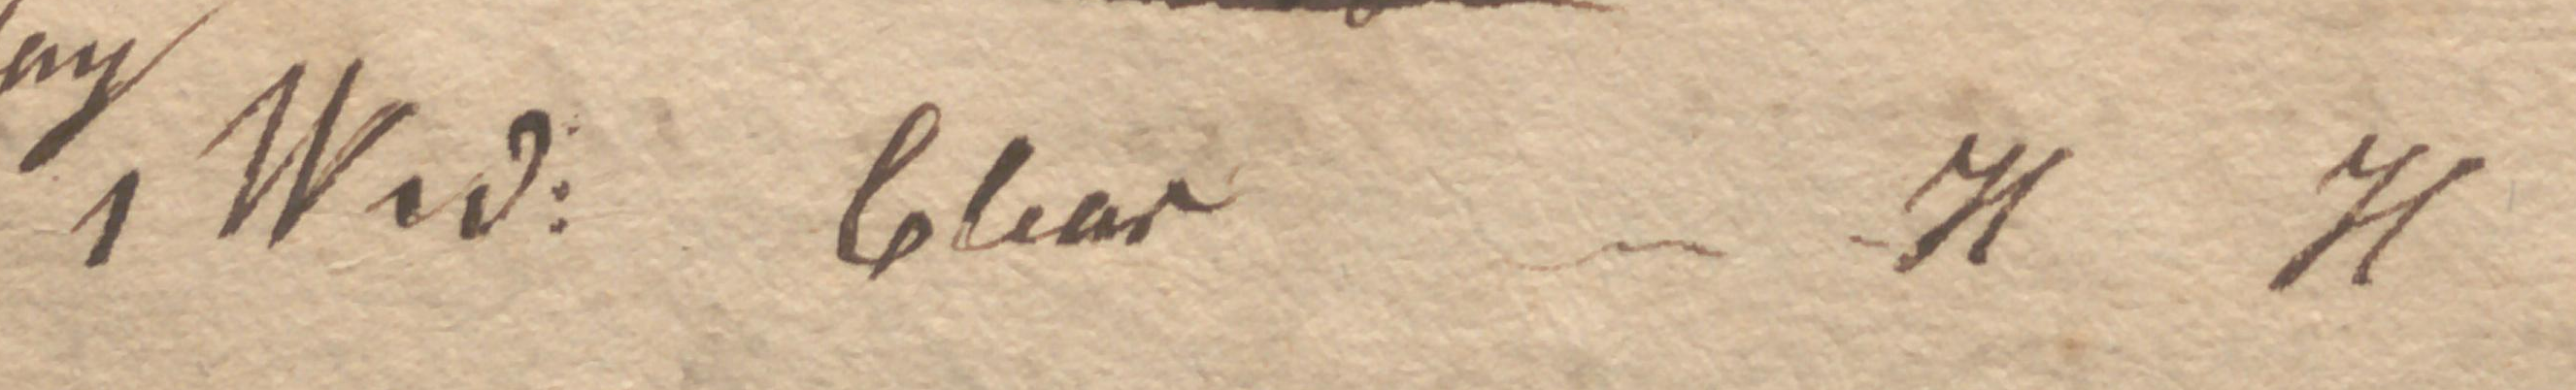1 Wed. Clear N H
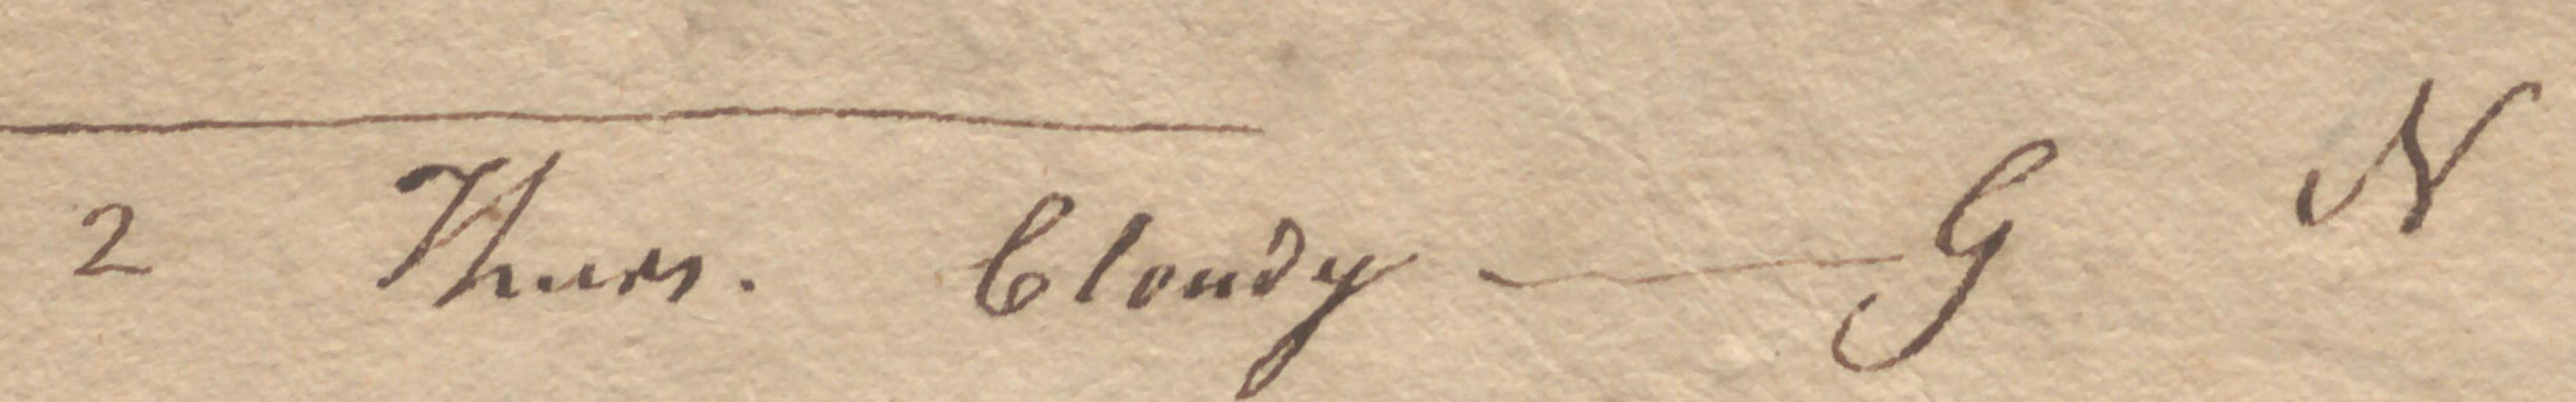2 Thurs. Cloudy G N
